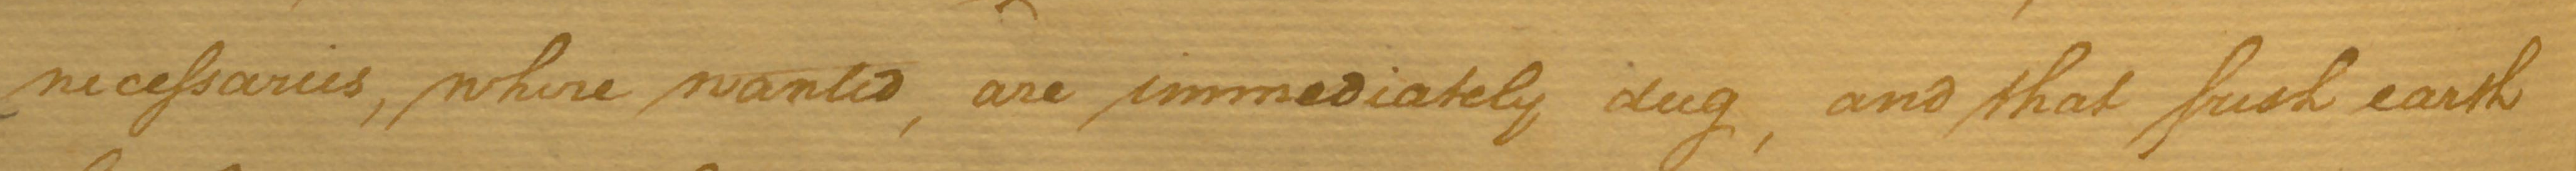necessaries, where wanted, are immediately dug, and that fresh earth
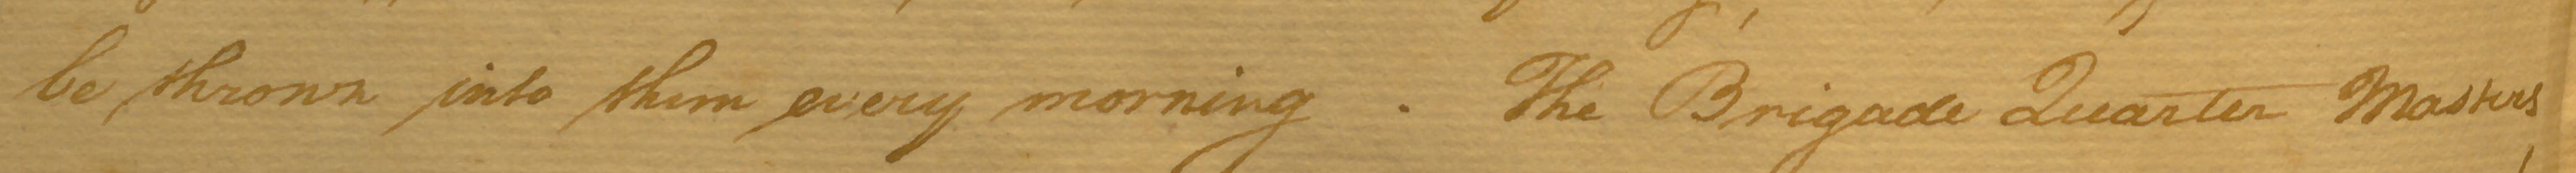be thrown into them every morning. The Brigade Quarter Masters
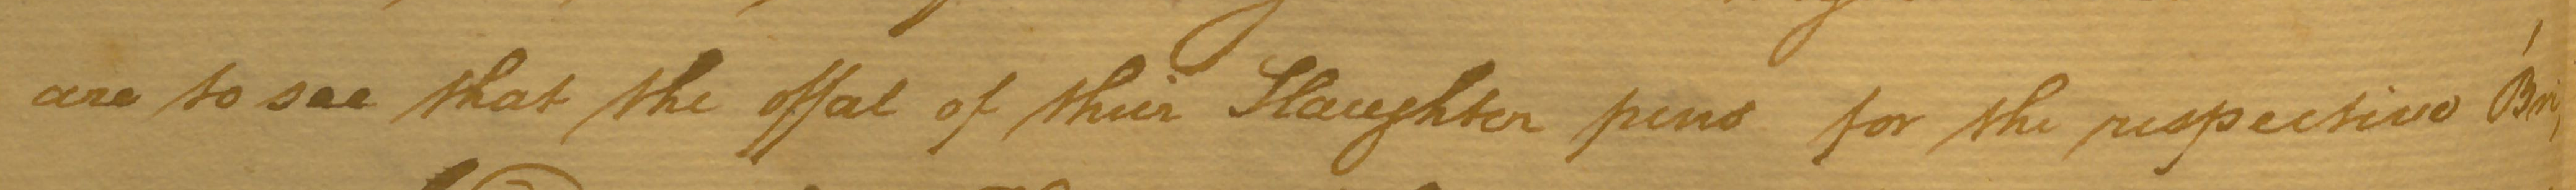are to see that the offal of their slaughter pens for the respective Bri
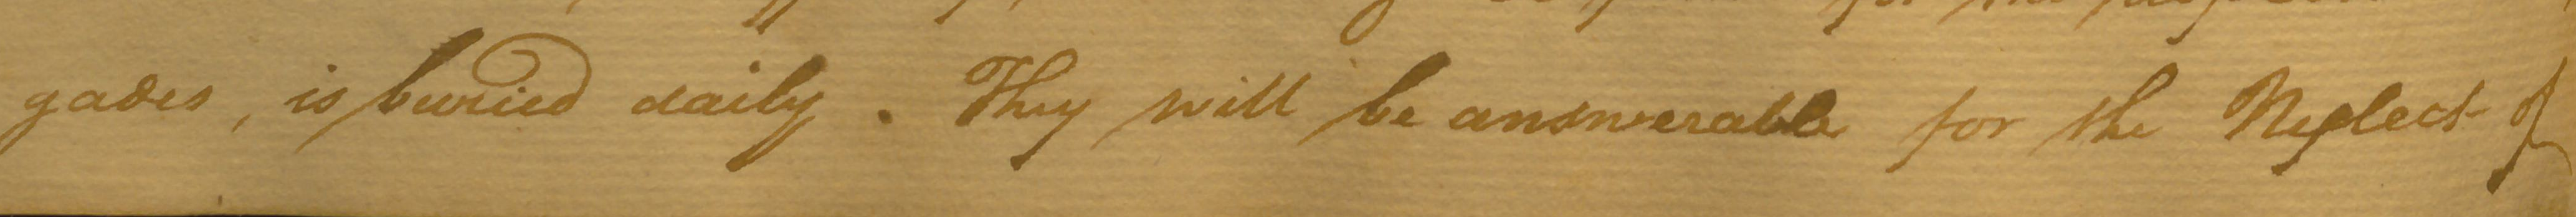gades, is buried daily. They will be answerable for the Neglect of
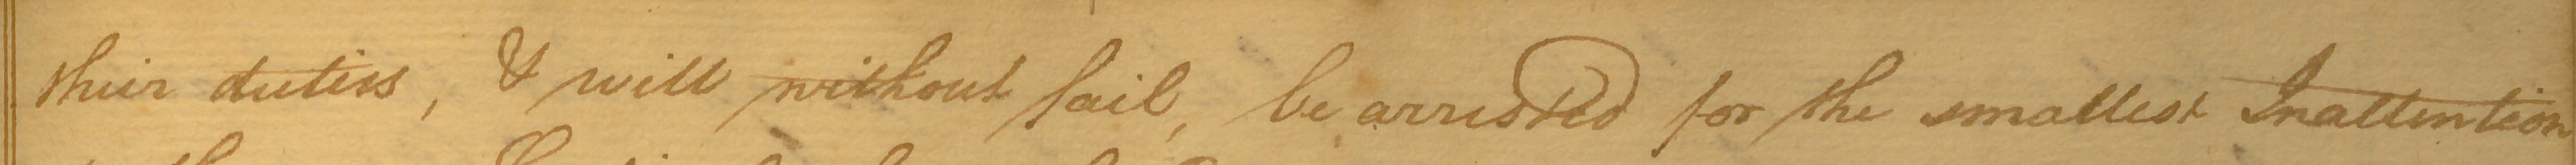their duties, & will without fail, be arrested for the smallest Inattention
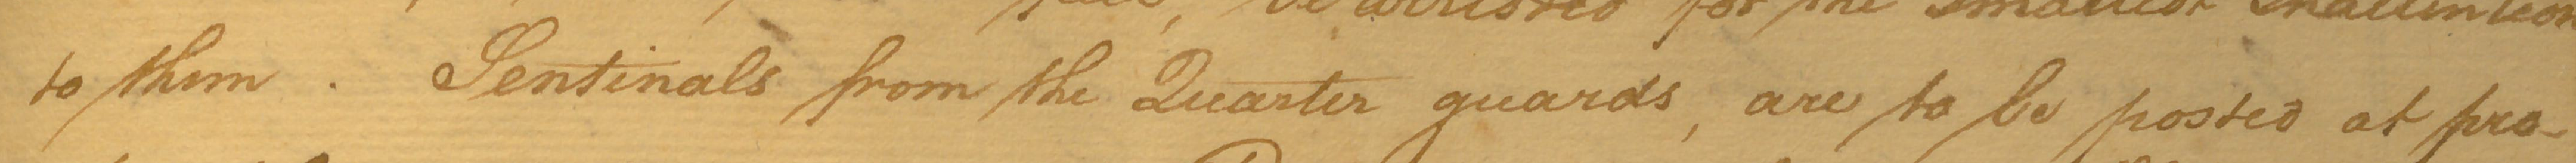to them. Sentinals from the Quarter guards, are to be posted at pro-
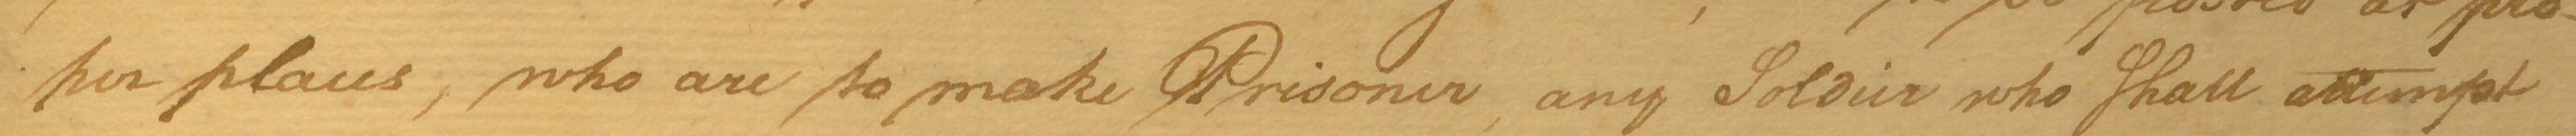per places, who are to make Prisoner, any soldier who shall attempt
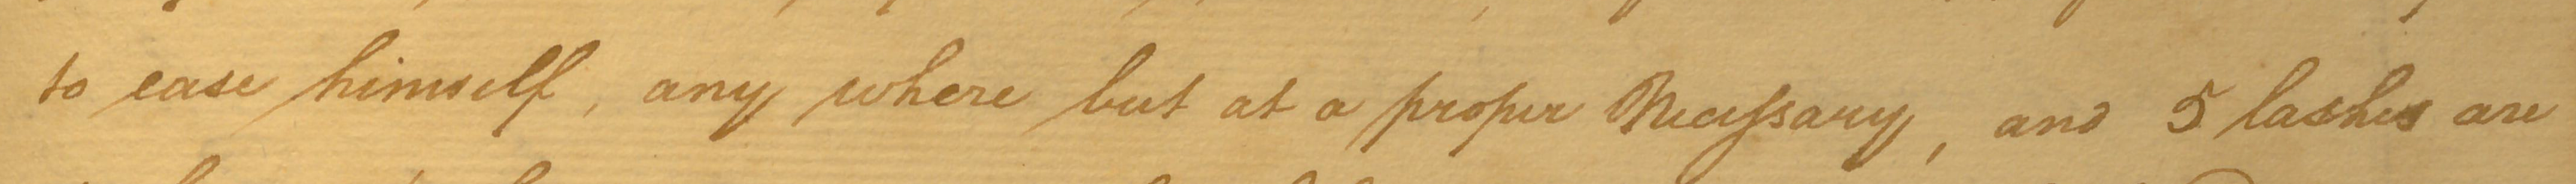to ease himself, any where but at a proper necessary, and 5 lashes are
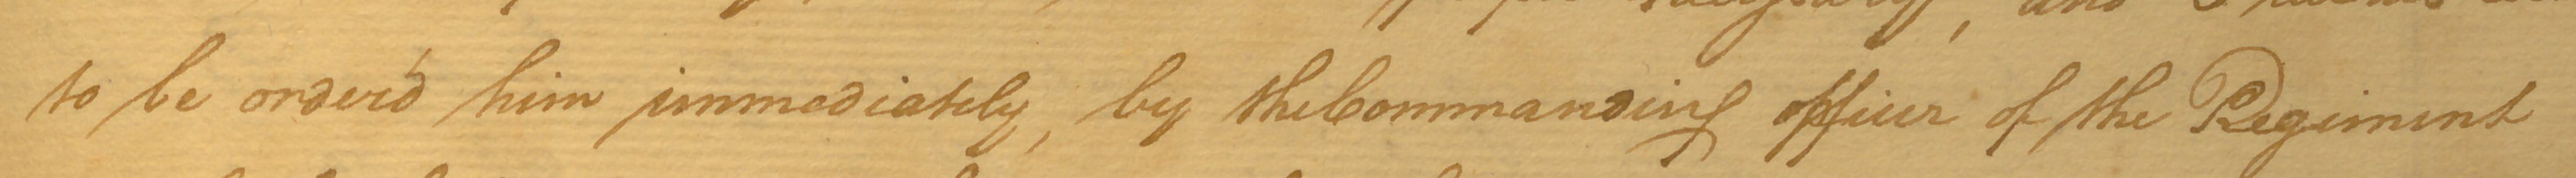to be order'd him immediately, by the Commanding officer of the Regiment
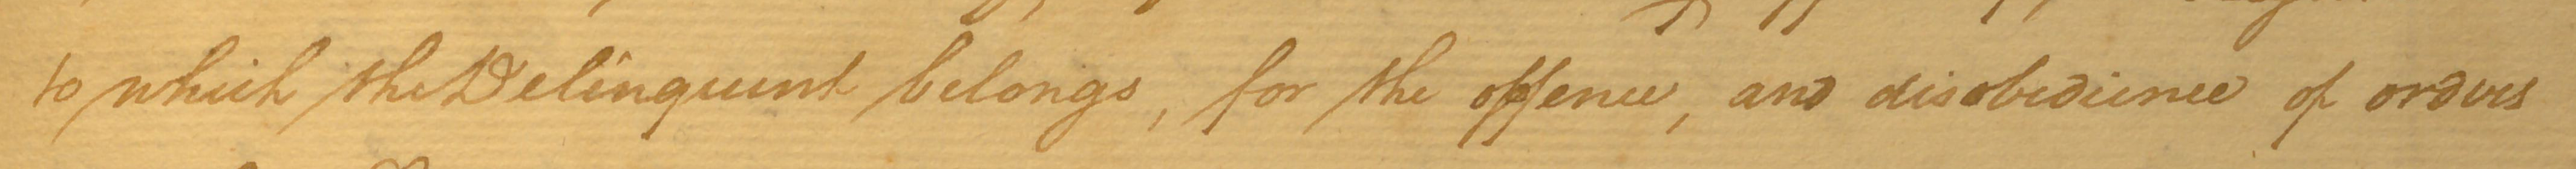to which the Delinquent belongs, for the offence, and disobedience of orders
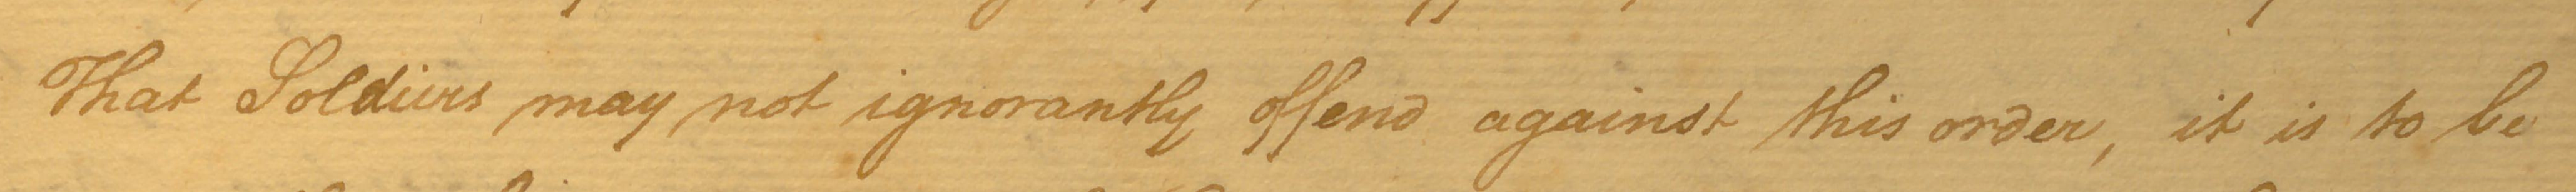That soldiers may not ignorantly offend against this order, it is to be
